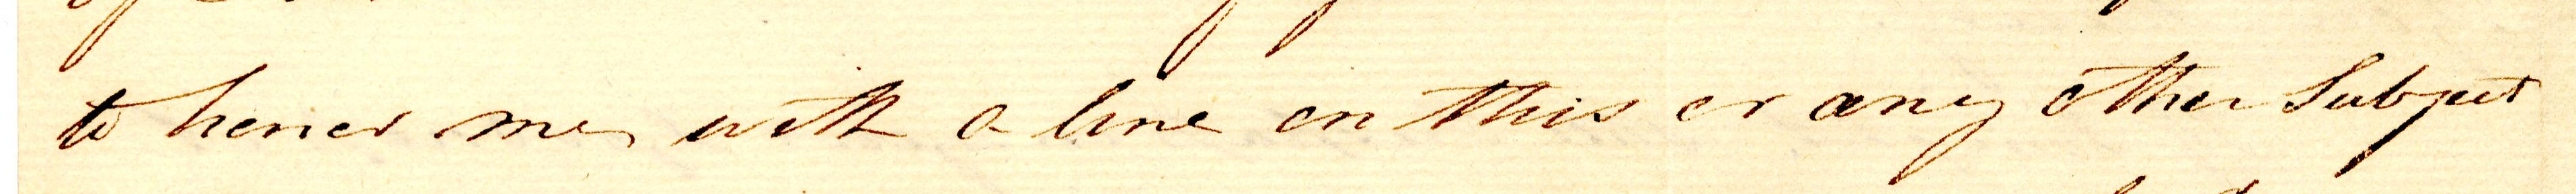to honor me with a line on this or any other subject
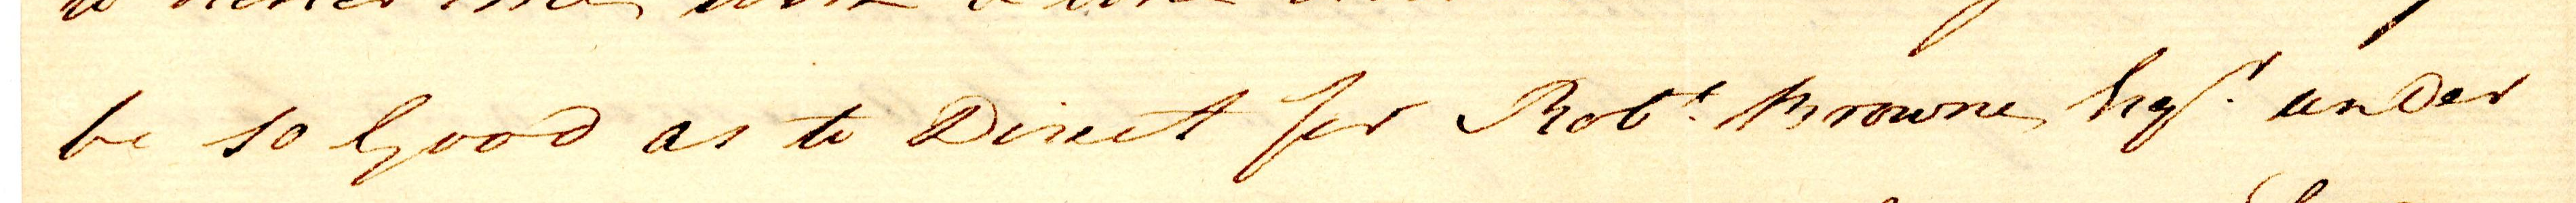be so Good as to Direct for Rob^t. Brown Esq^r. under
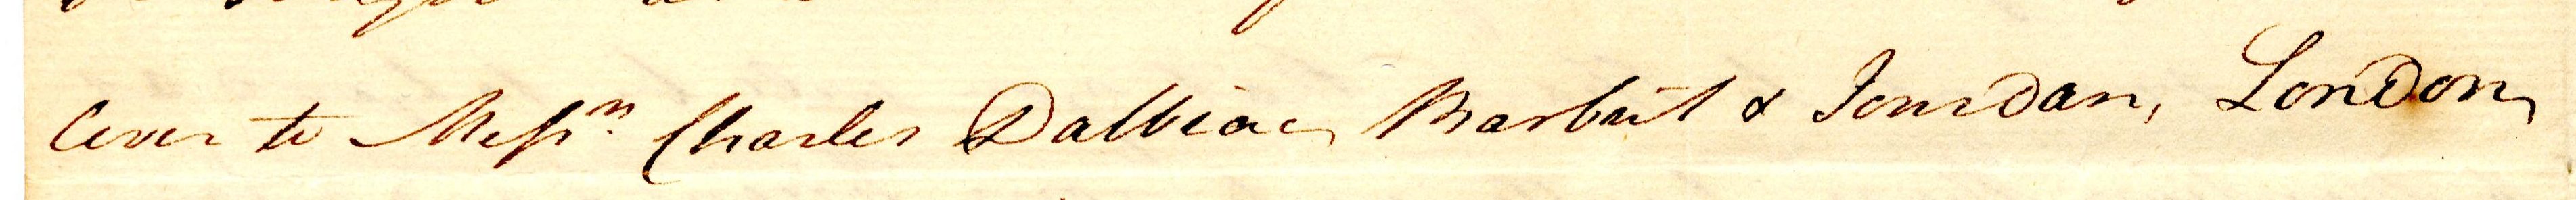cover to Mess^r. Charles Dalbiac Barbait & Jordan, London
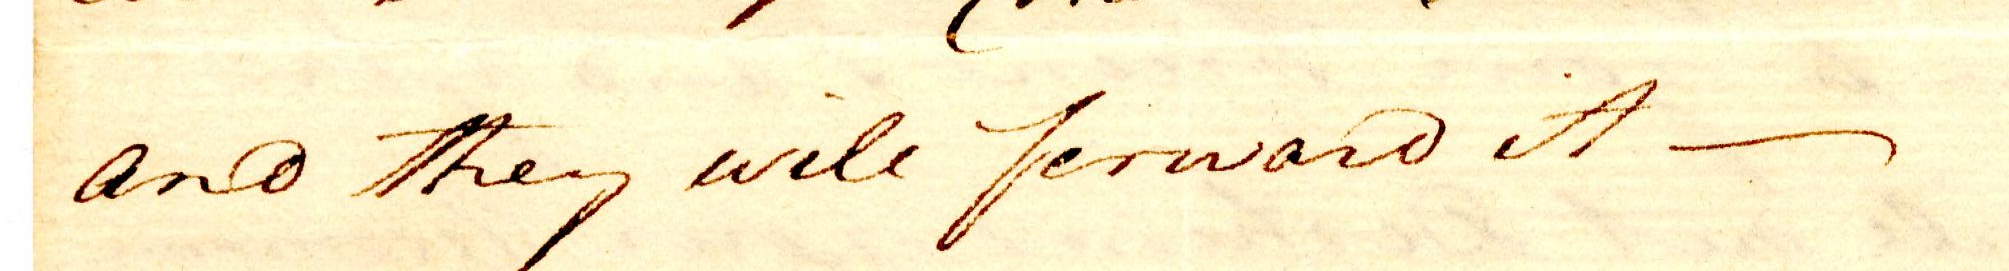and they will forward it-
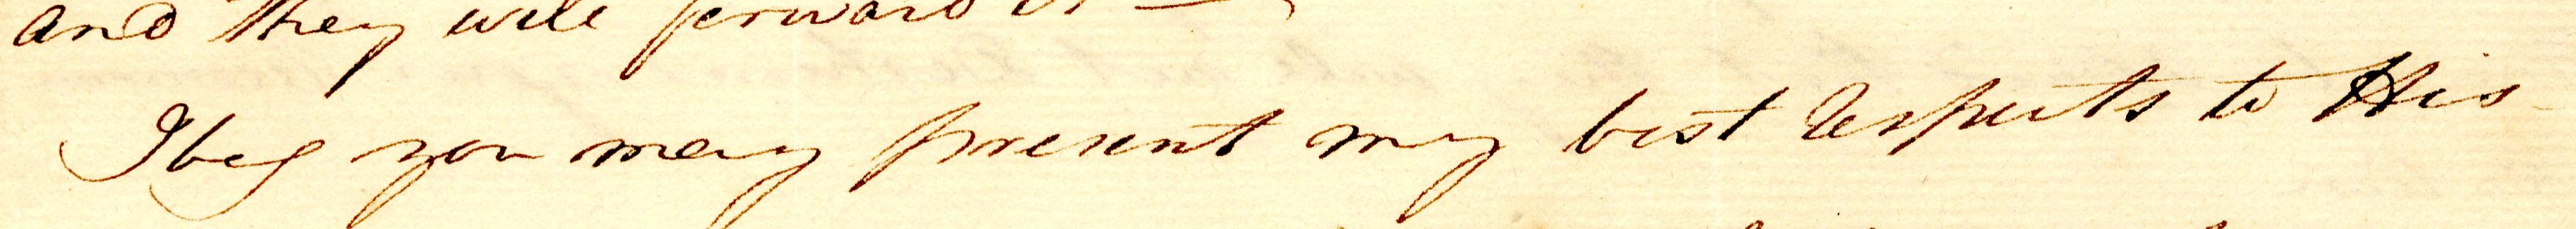I beg you may present my best respects to His
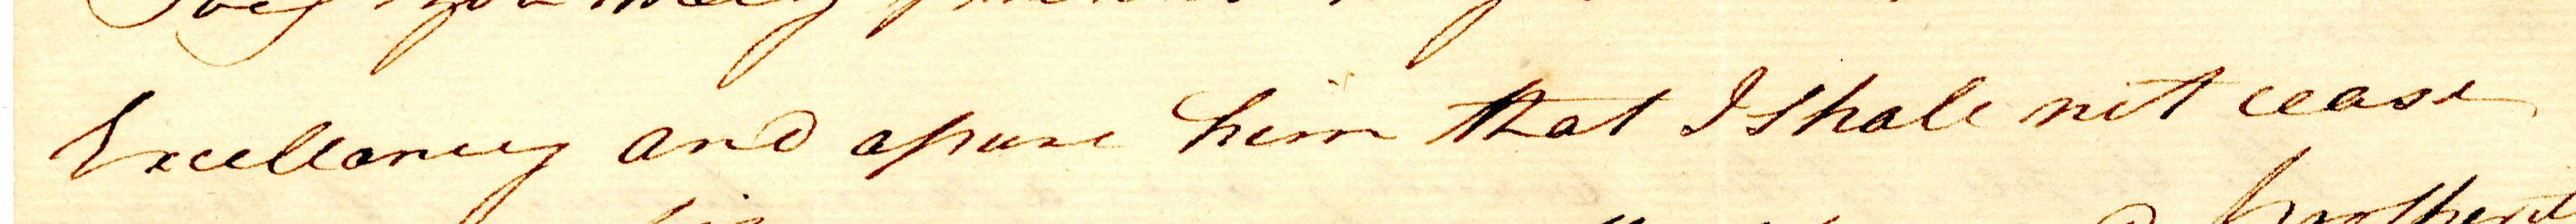Excellancy and assure him that I shall not cease
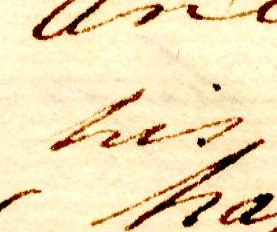his
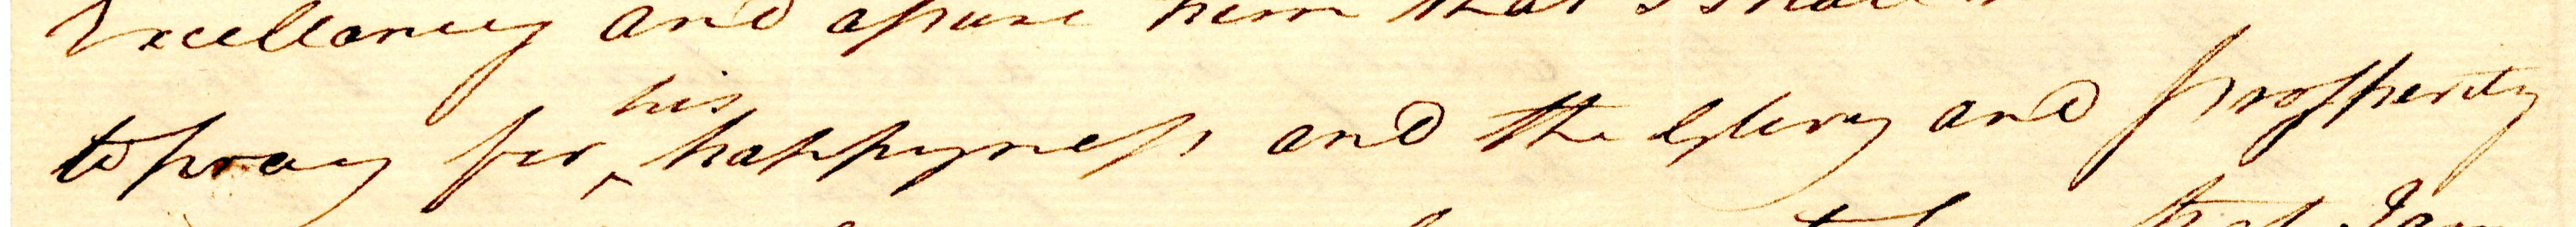to pray for ^ happyness, and the Glory and prosperity
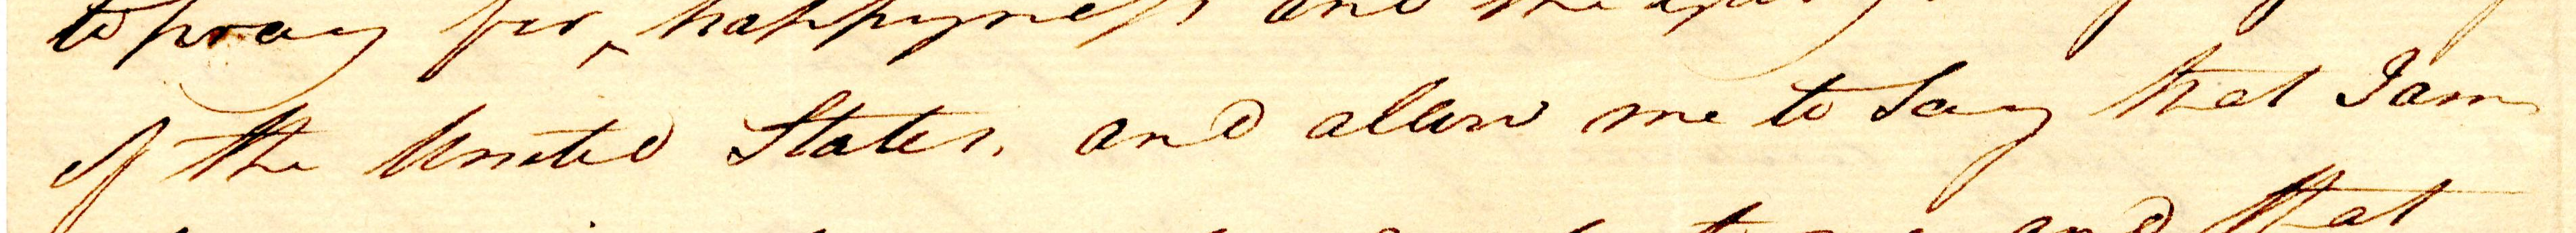of the United States, and allow me to say that I am
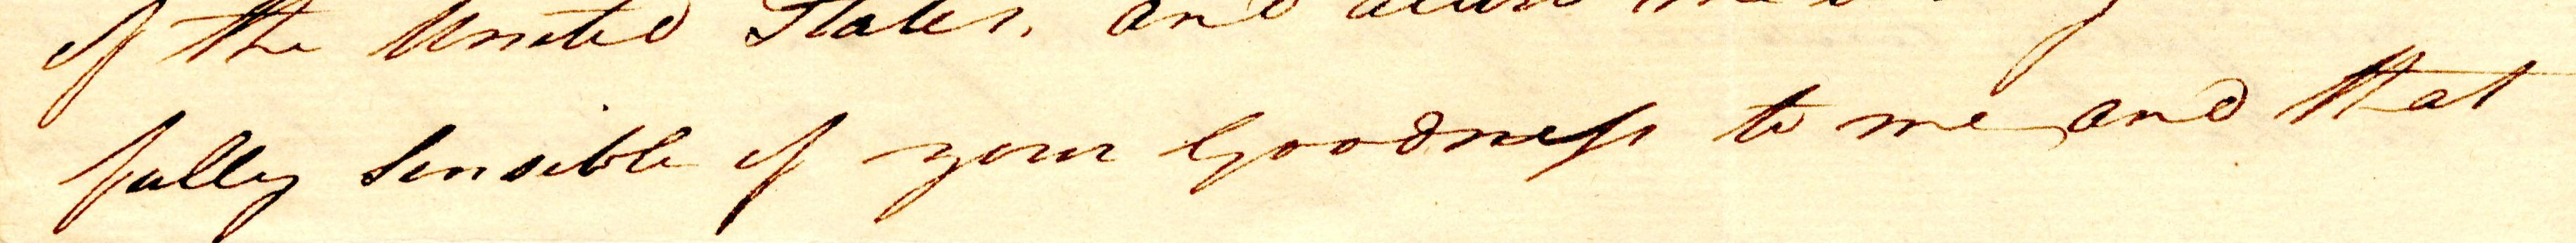fully sensible of your Goodness to me and that
